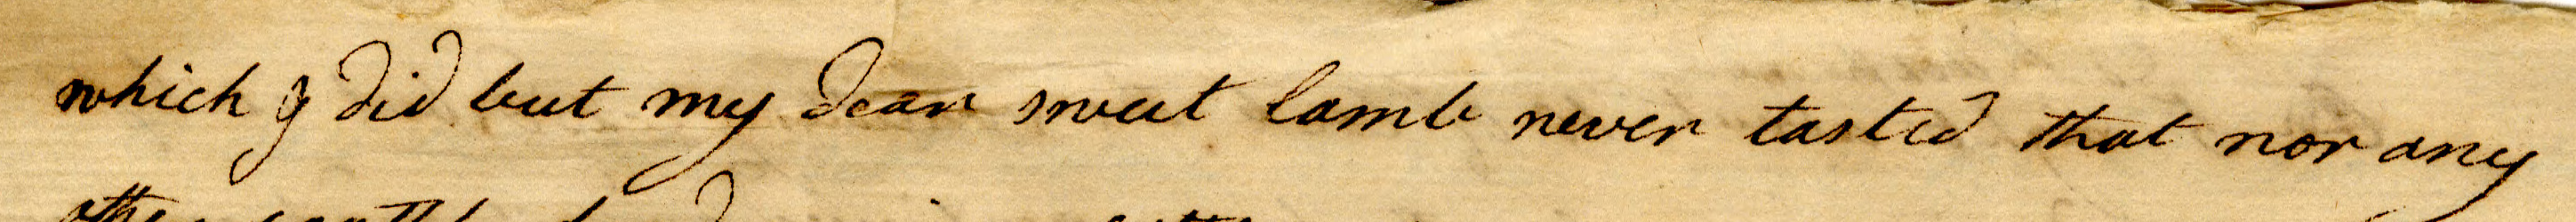which I did but my dear sweet lamb never tasted that nor any
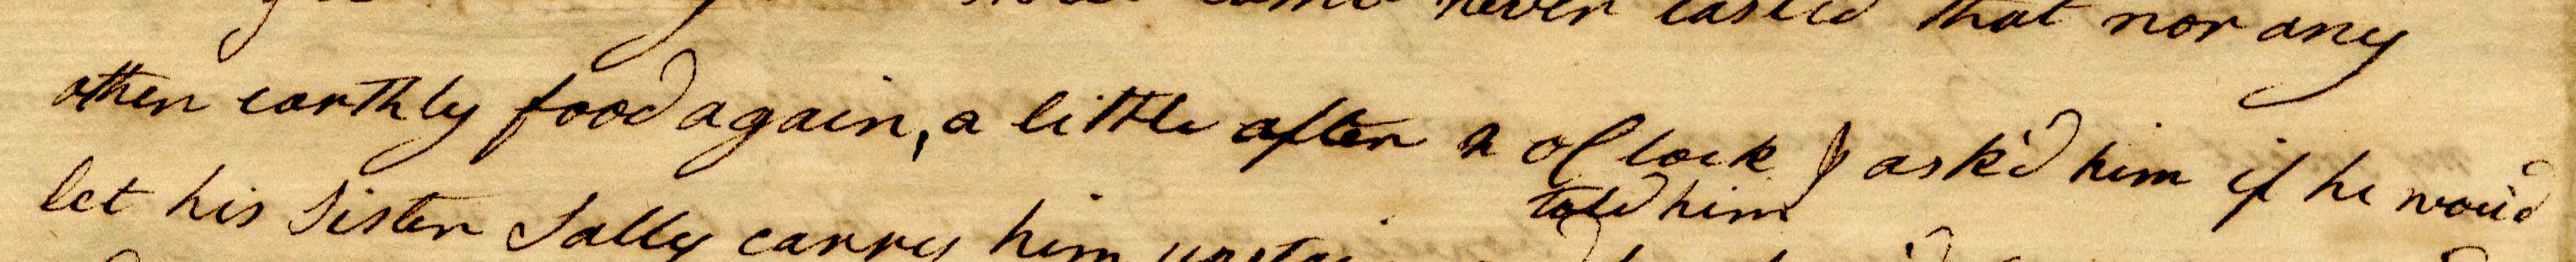other earthly food again, a little after 2 oClock I ask'd him if he wou'd
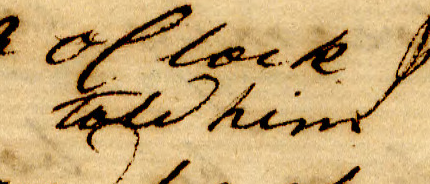told him
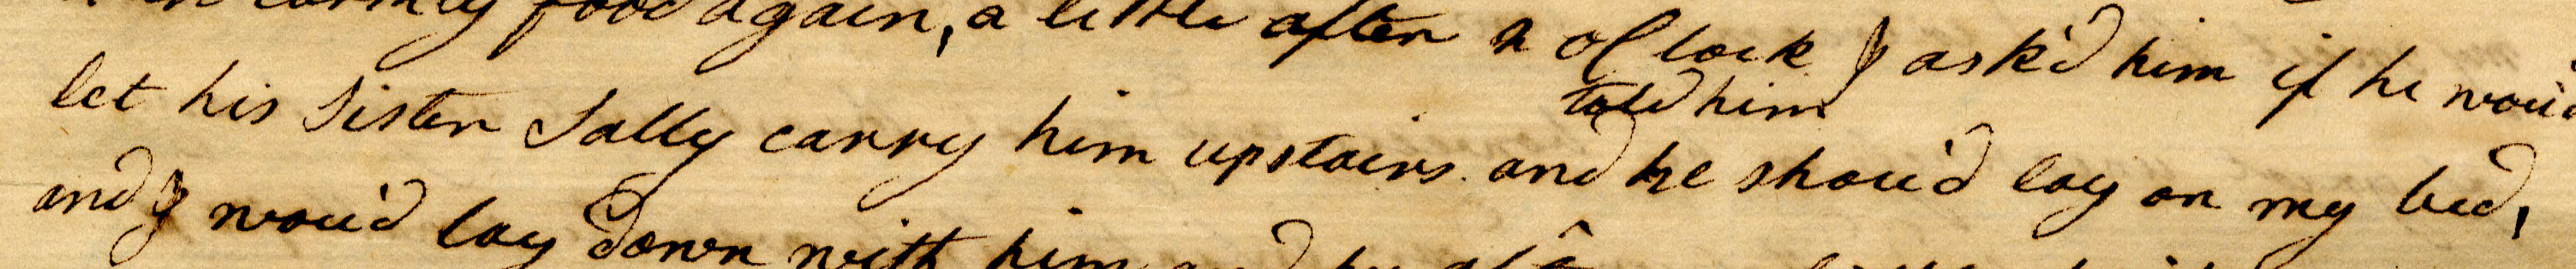let his sister Sally carry him upstairs and he shou'd lay on my bed,
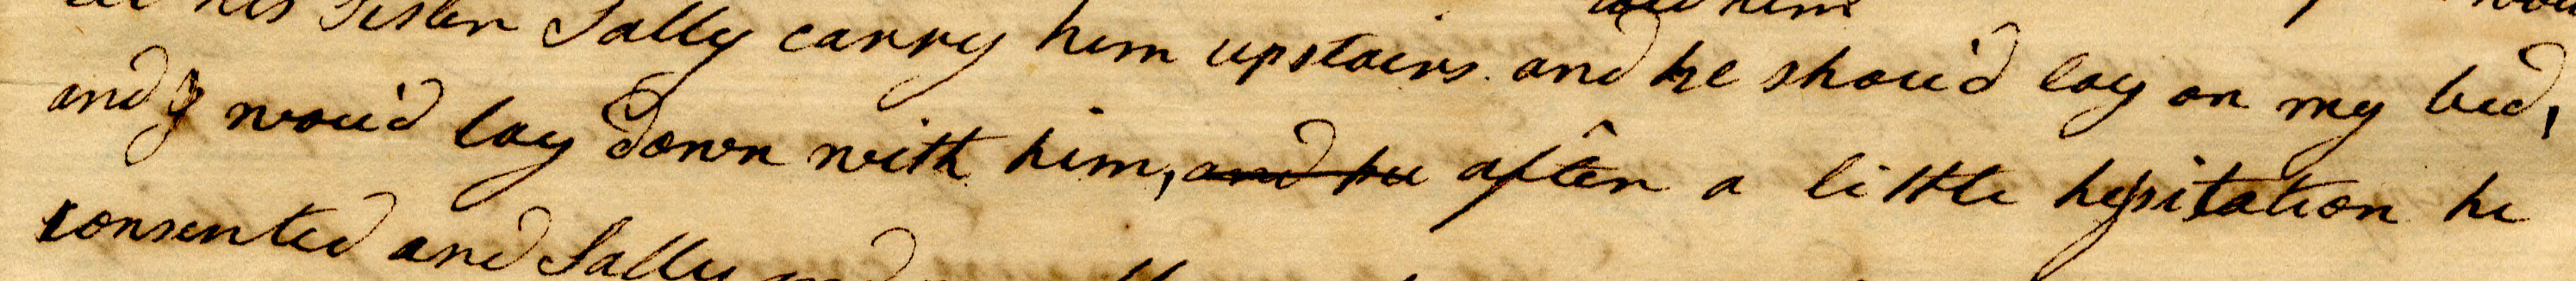and I wou'd lay down with him, after a little hesitation he
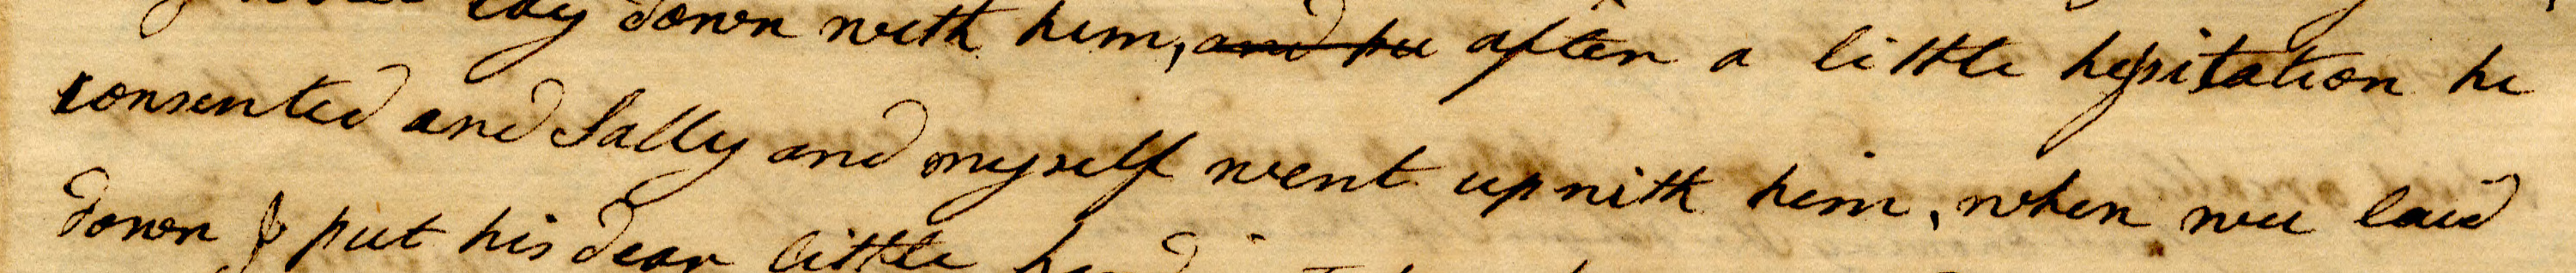consented and Sally and myself went up with him, when wee laid
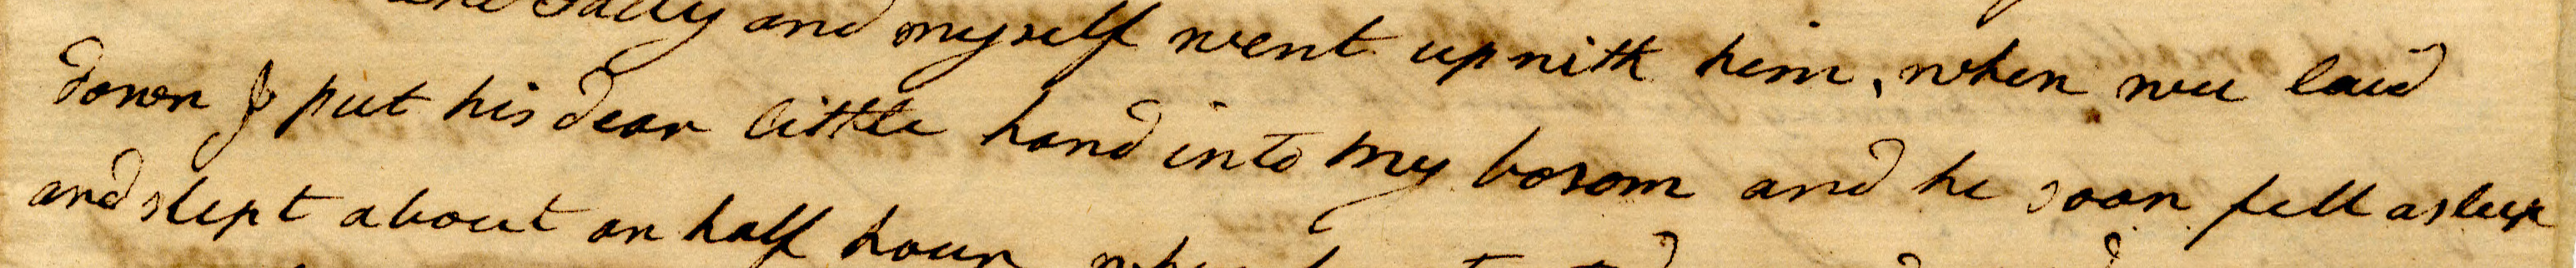down I put his dear little hand into my bosom and he soon fell asleep
